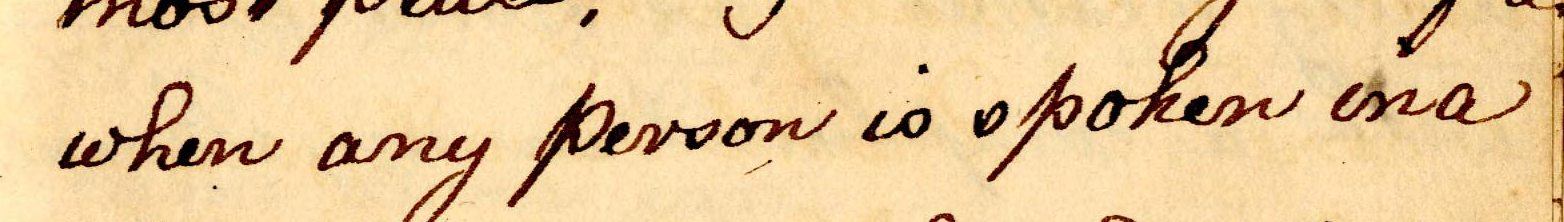when any person is spoken in a
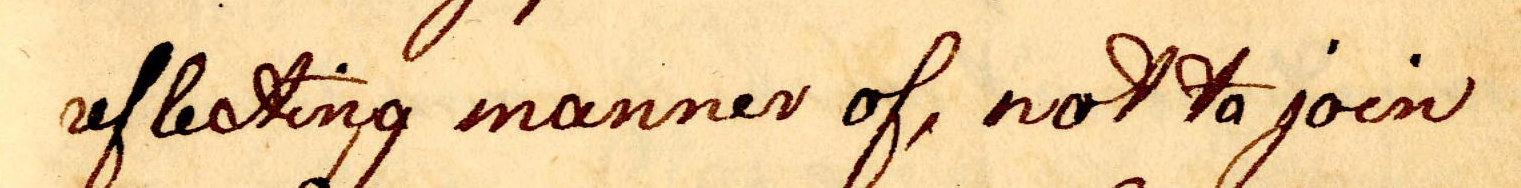reflecting manner of, not to join
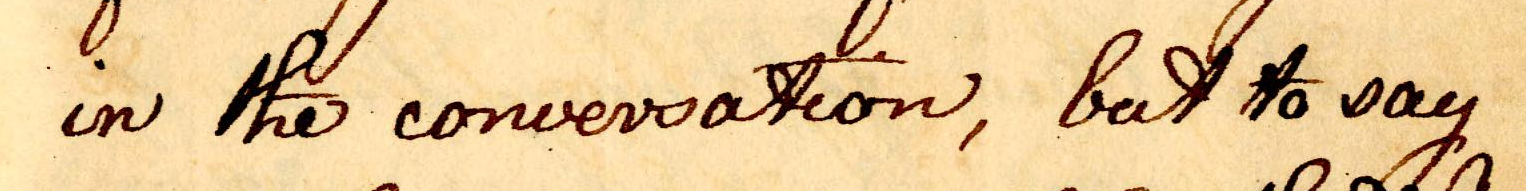in the conversation, but to say
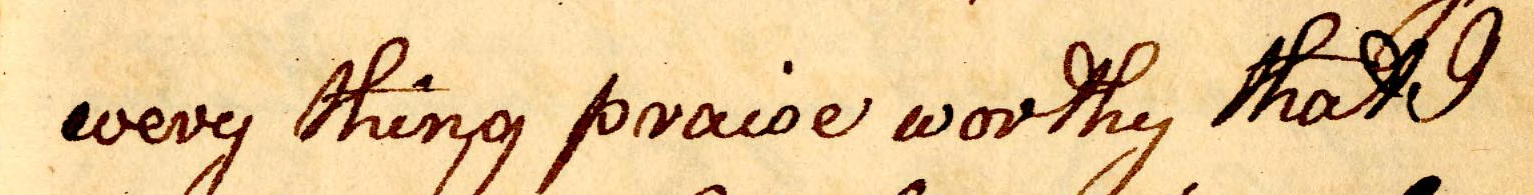every thing praise worthy that I
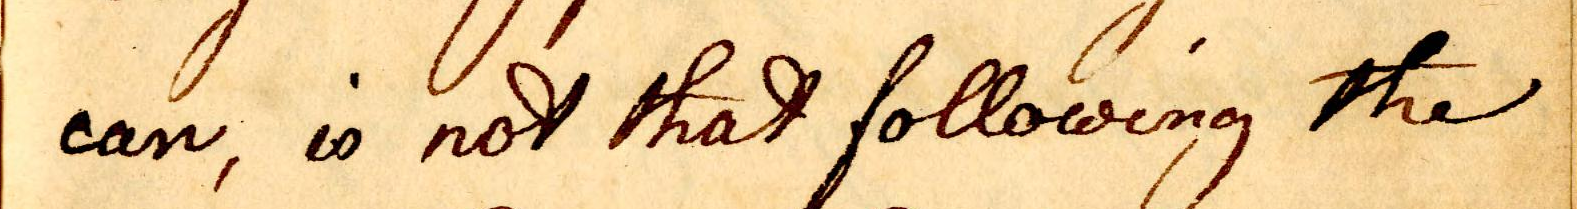can, is not that following the
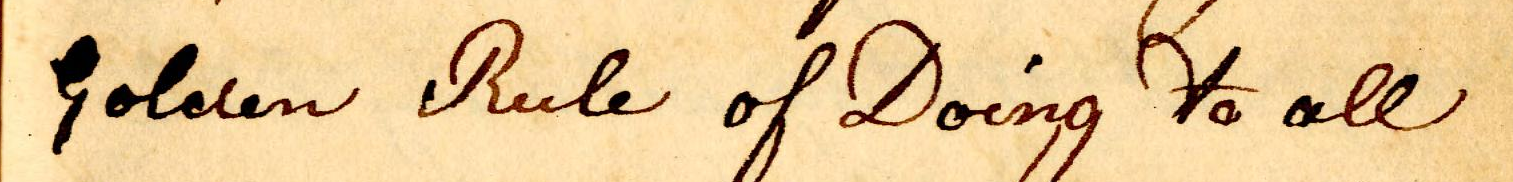Golden Rule of Doing to all
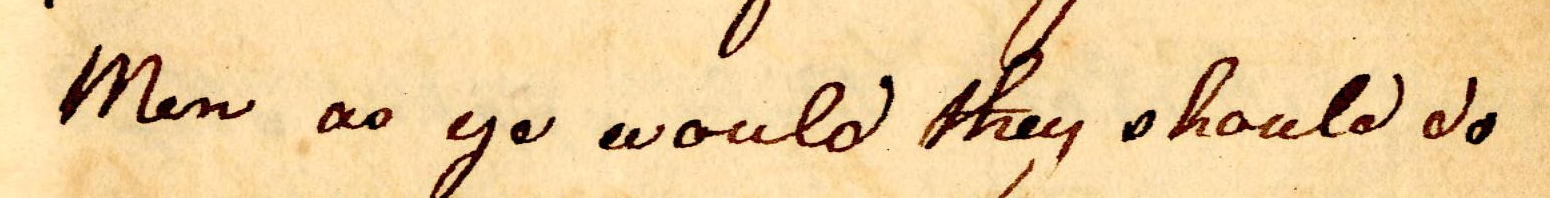Men as ye would they should do
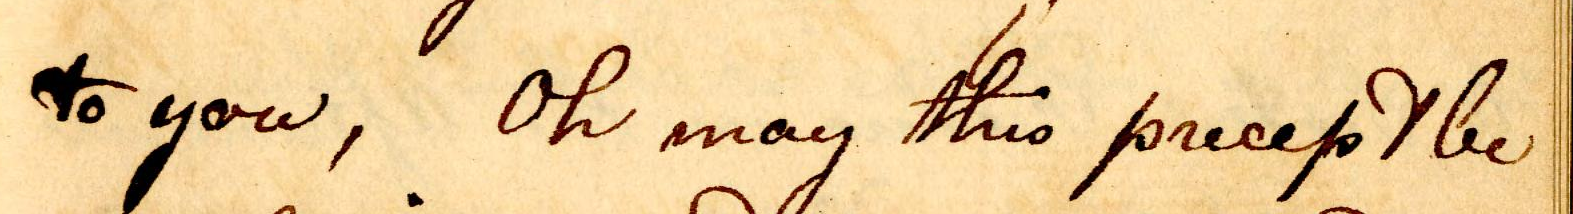to you, Oh may this precept be
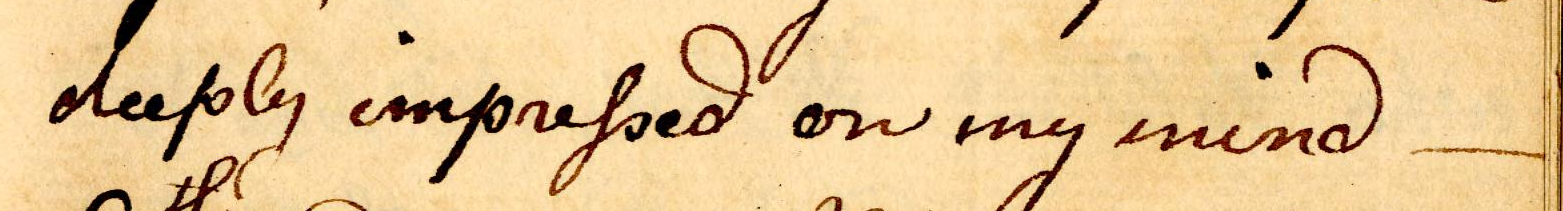deeply impressed on my mind-
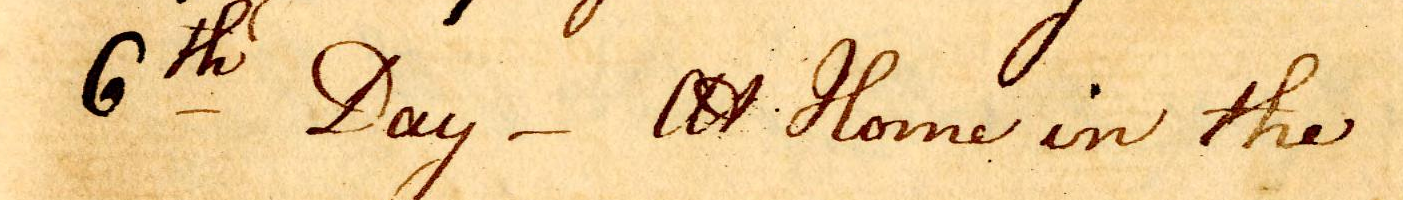6^th Day- At Home in the
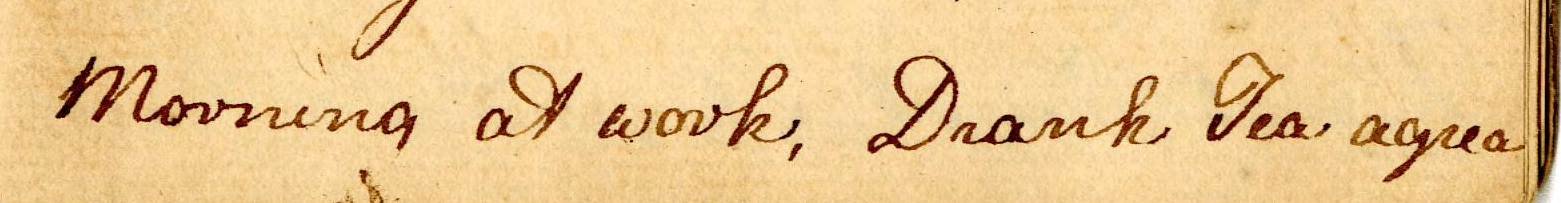Morning at work, Drank Tea agrea
